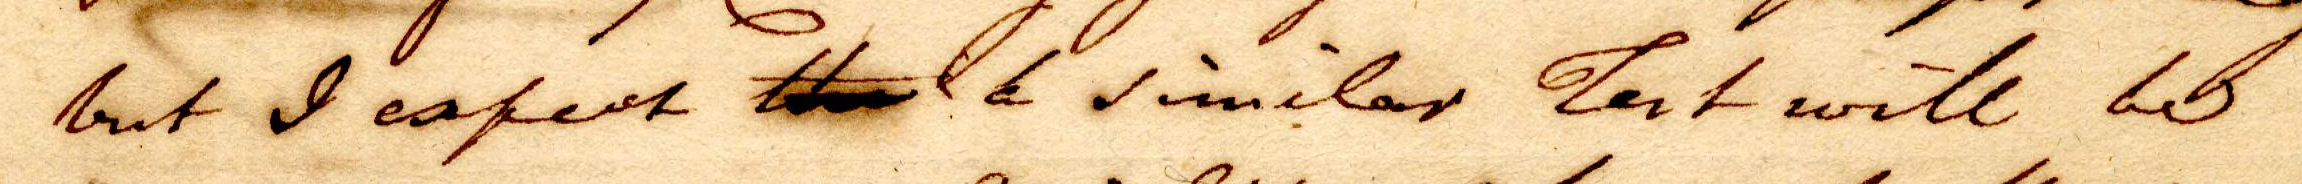but I expect that a similar Test will be
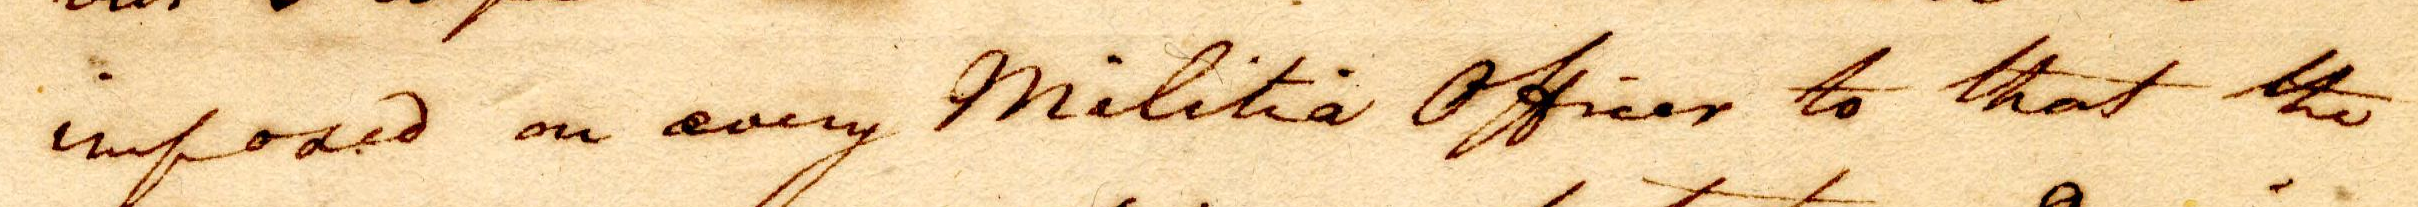imposed on every Militia Officer to that the
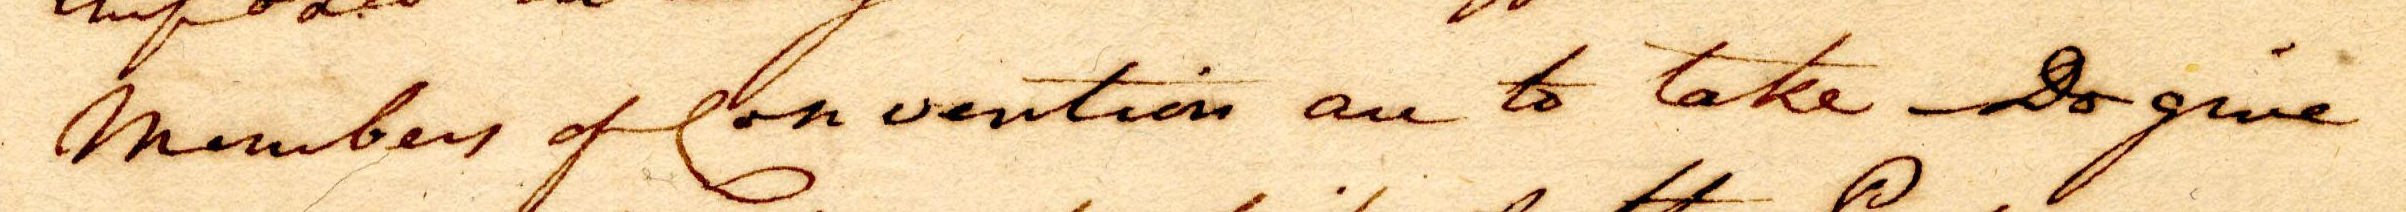Members of Convention are to take. Do give
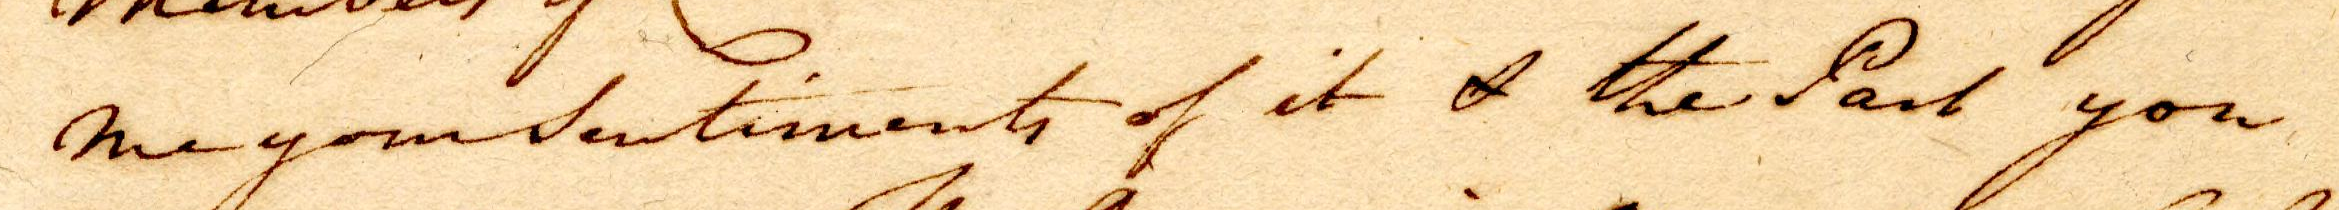me your Sentiments of it & the Part you
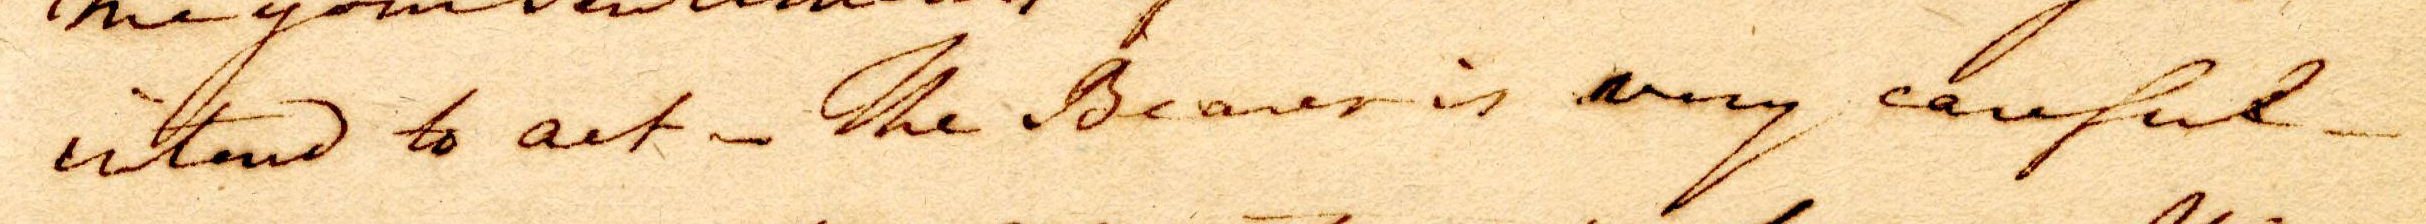intend to act. The Beaver is very careful.
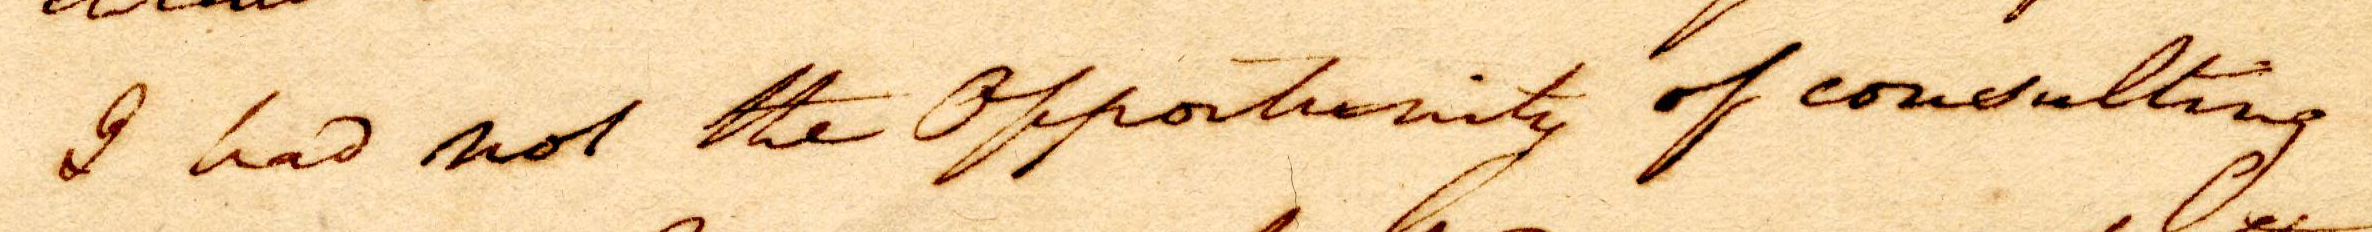I had not the Opportunity of consulting
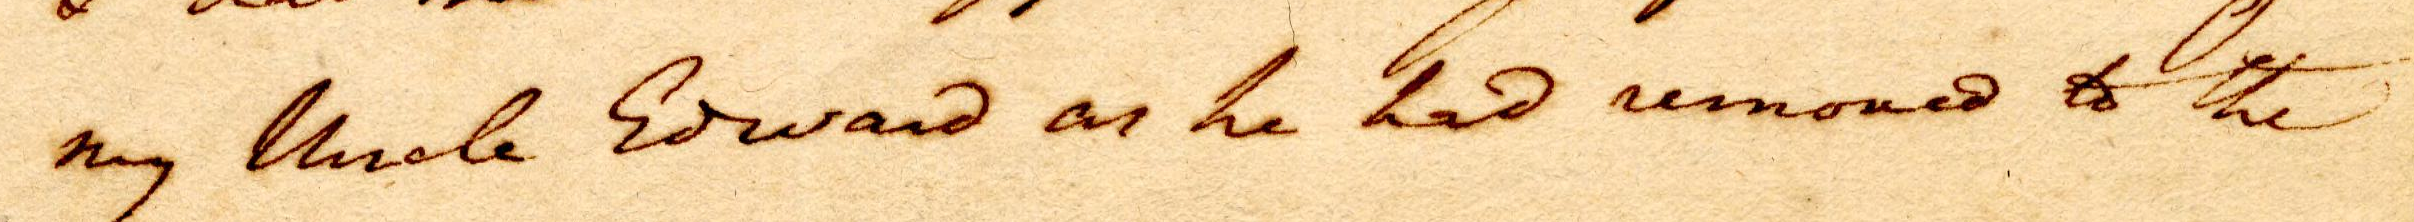my Uncle Edward as he had removed to the
